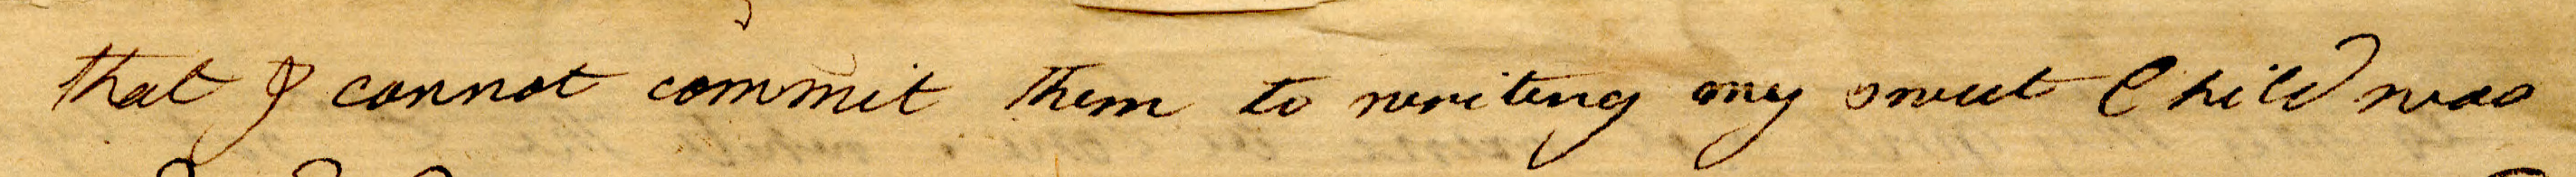that I cannot commit them to writing my sweet Child was
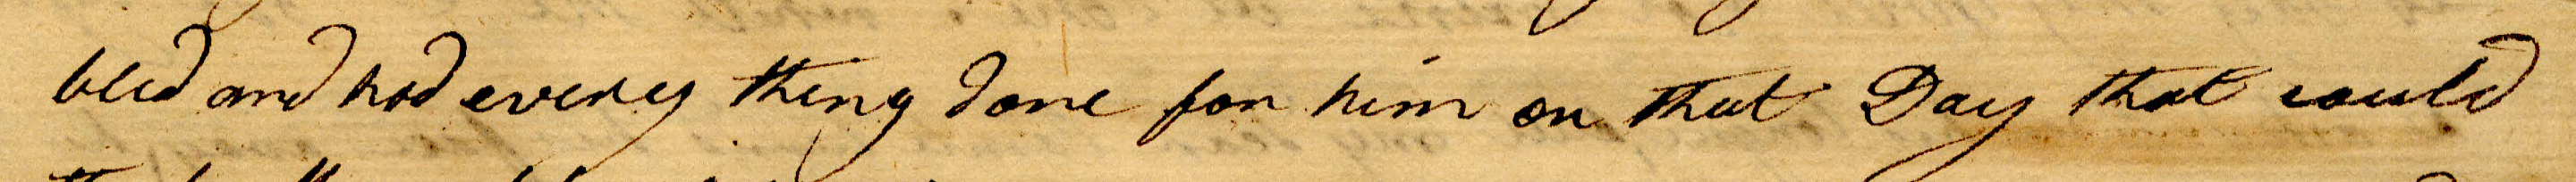bled and had every thing done for him on that Day that could
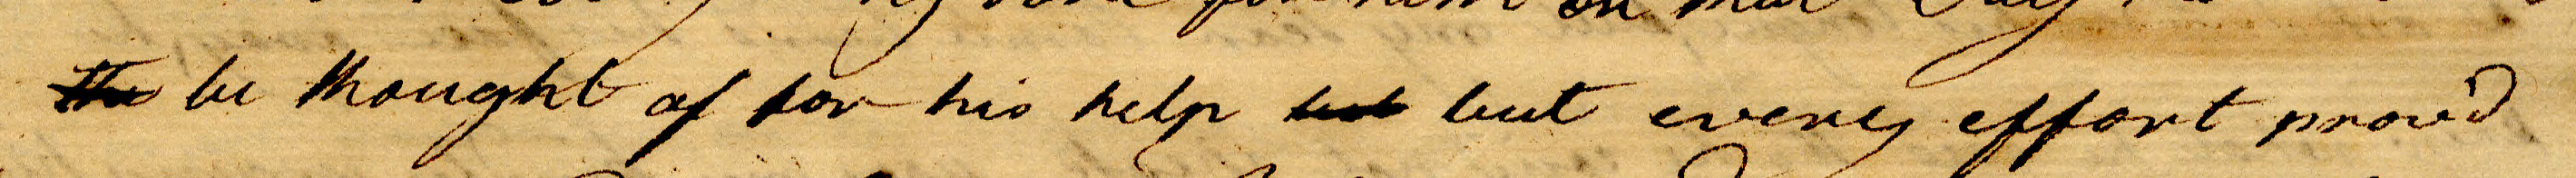[the] be thought of for his help but every effort prov'd
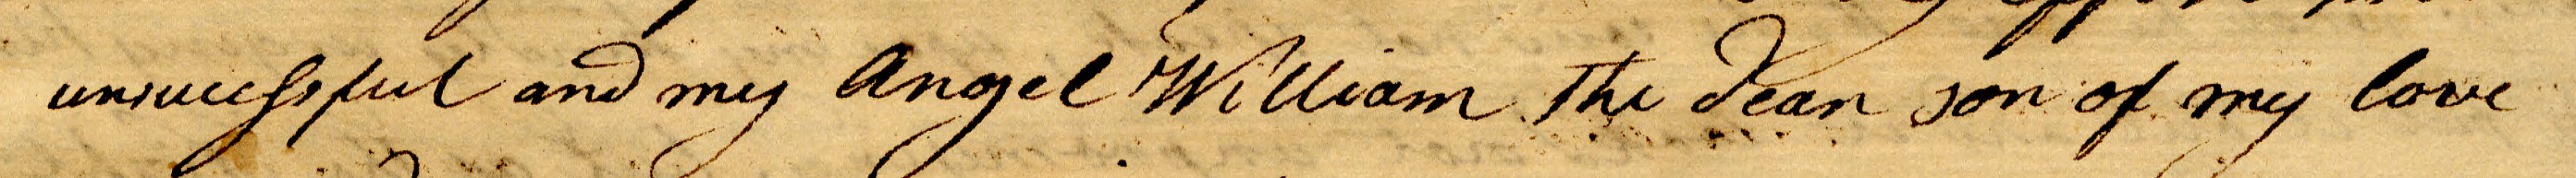unsuccessful and my Angel William the dear son of my love
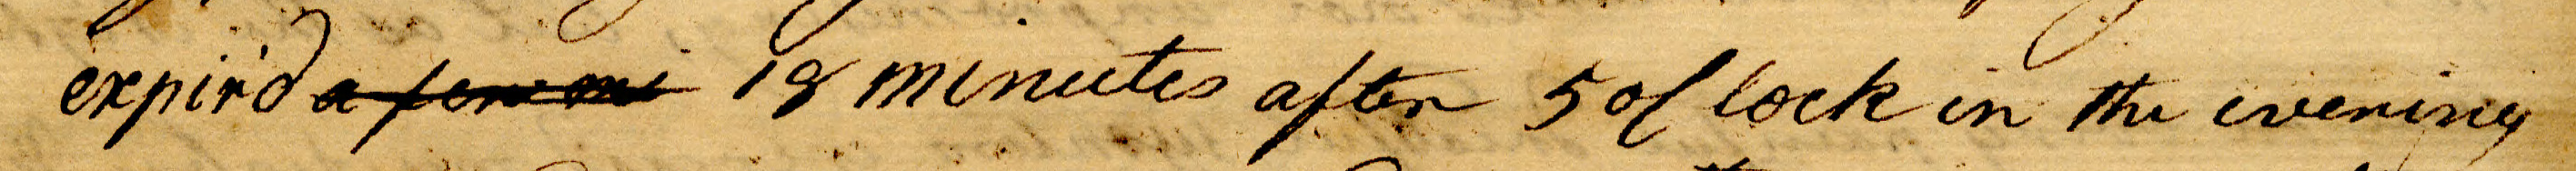expir'd [a few mi] 18 minutes after 5 oClock in the evening
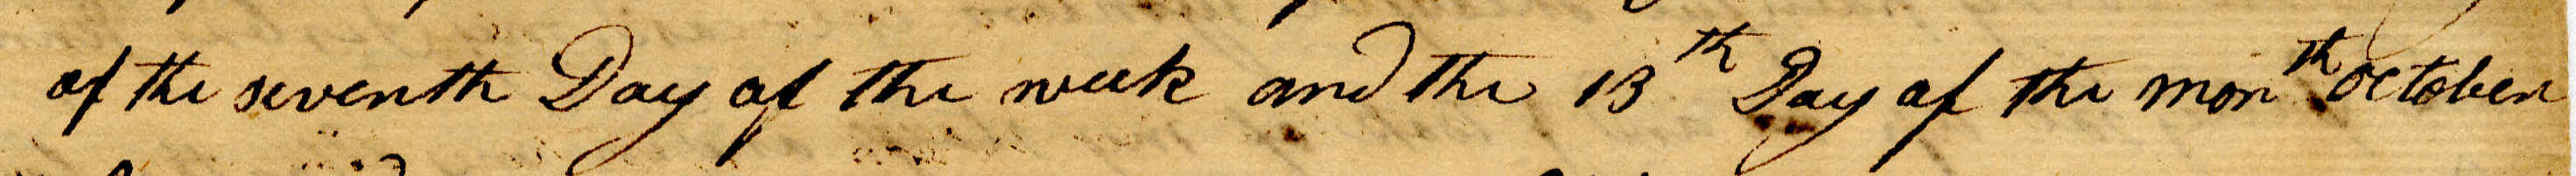of the seventh Day of the week and the 13^th Day of the mon^th October
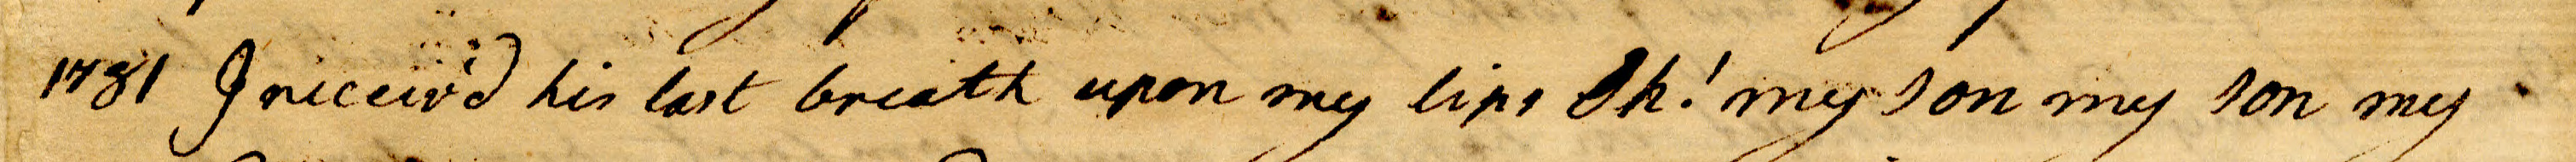1781 I riceiv'd his last breath upon my lips Oh! my son my son my
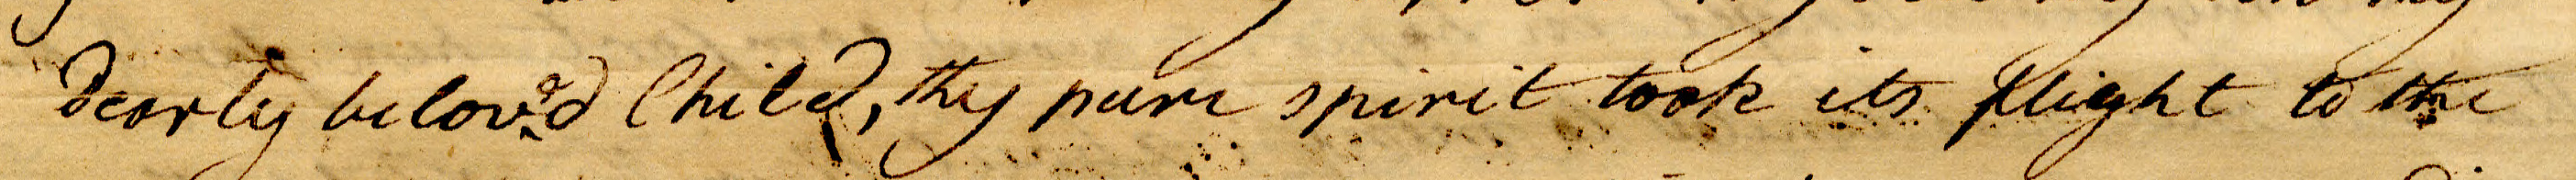dearly beloved Child, thy pure spirit took its flight to the
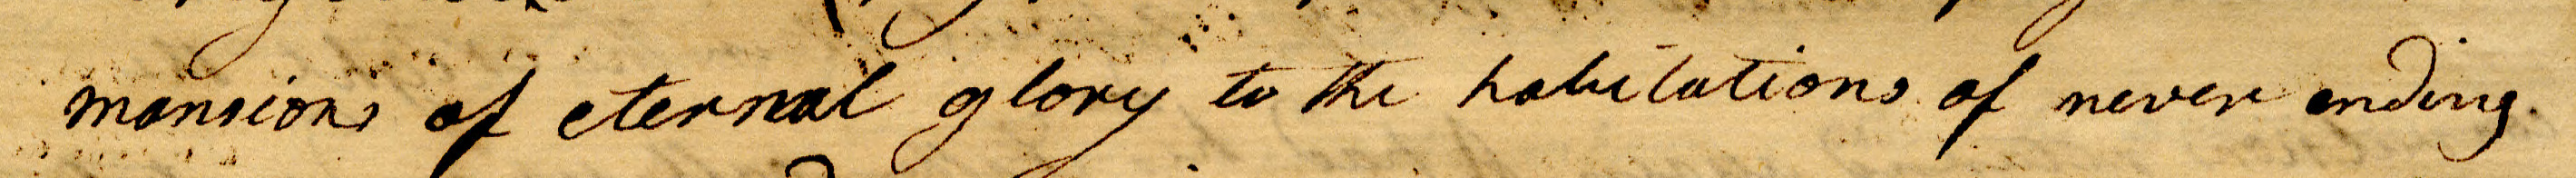mansions of eternal glory to the habitations of never ending
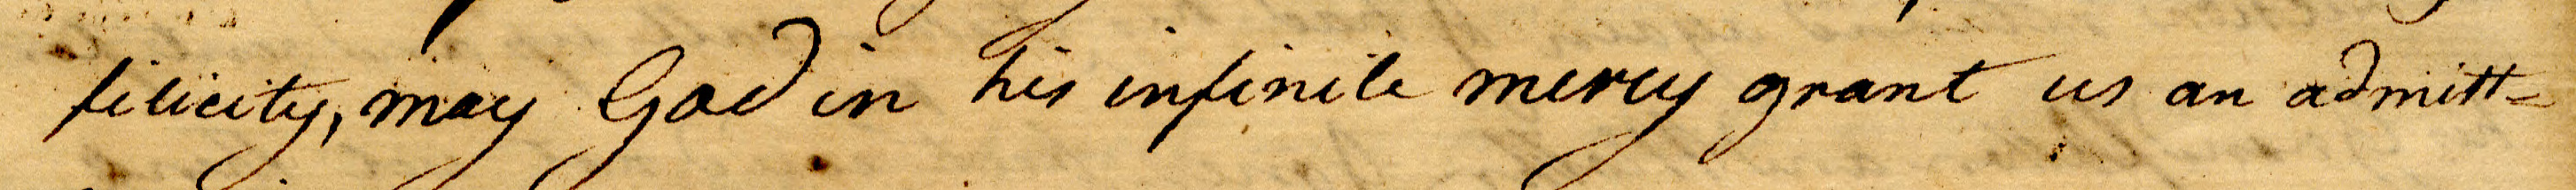felicity, may God in his infinite mercy grant us an admitt-
